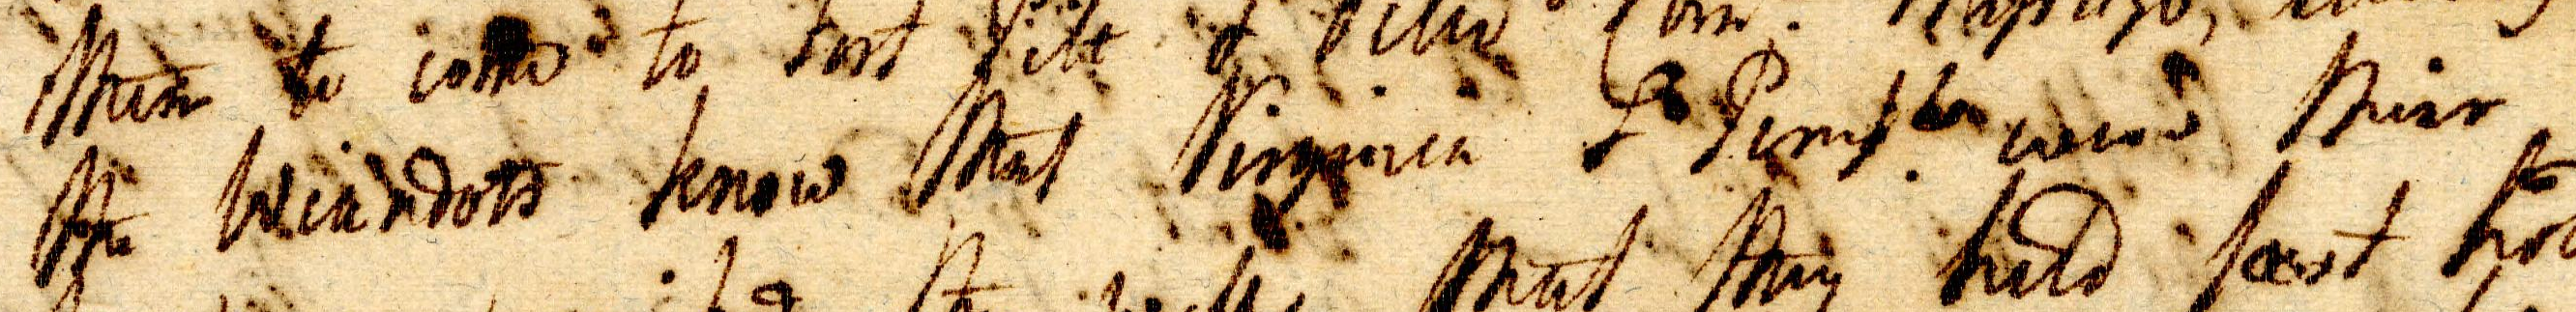the Wiandots know that Virginia & Penns^a were their
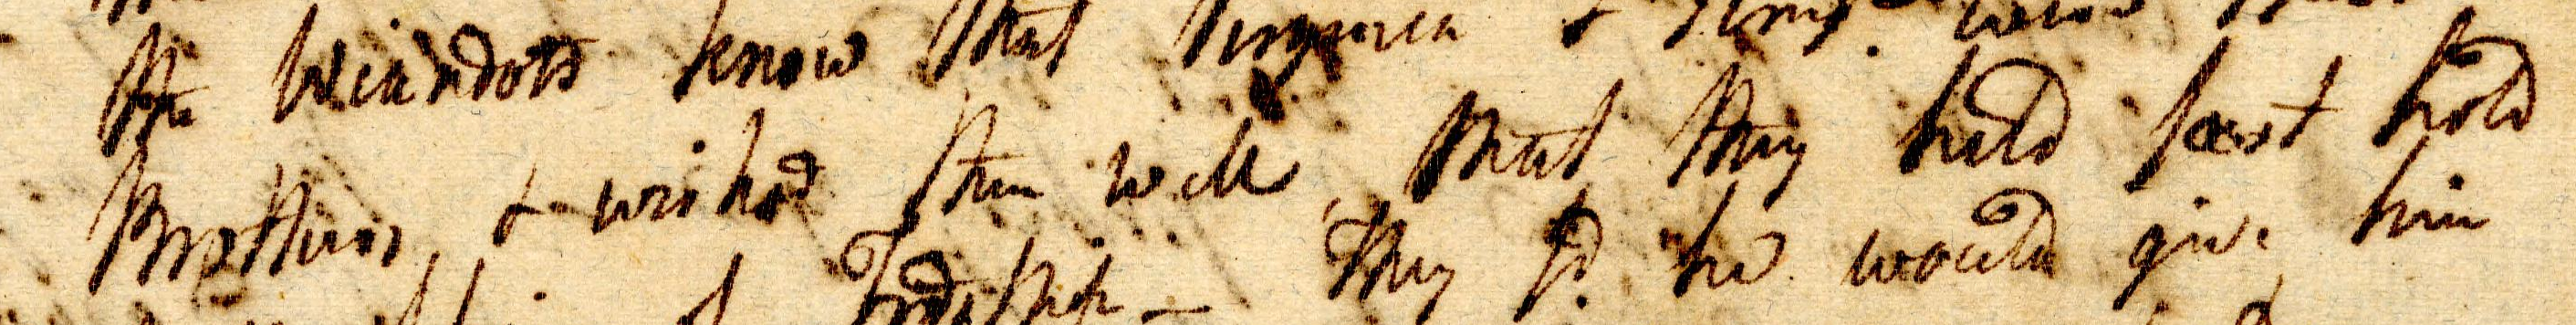Brothers & wished them well, that they held fast hold
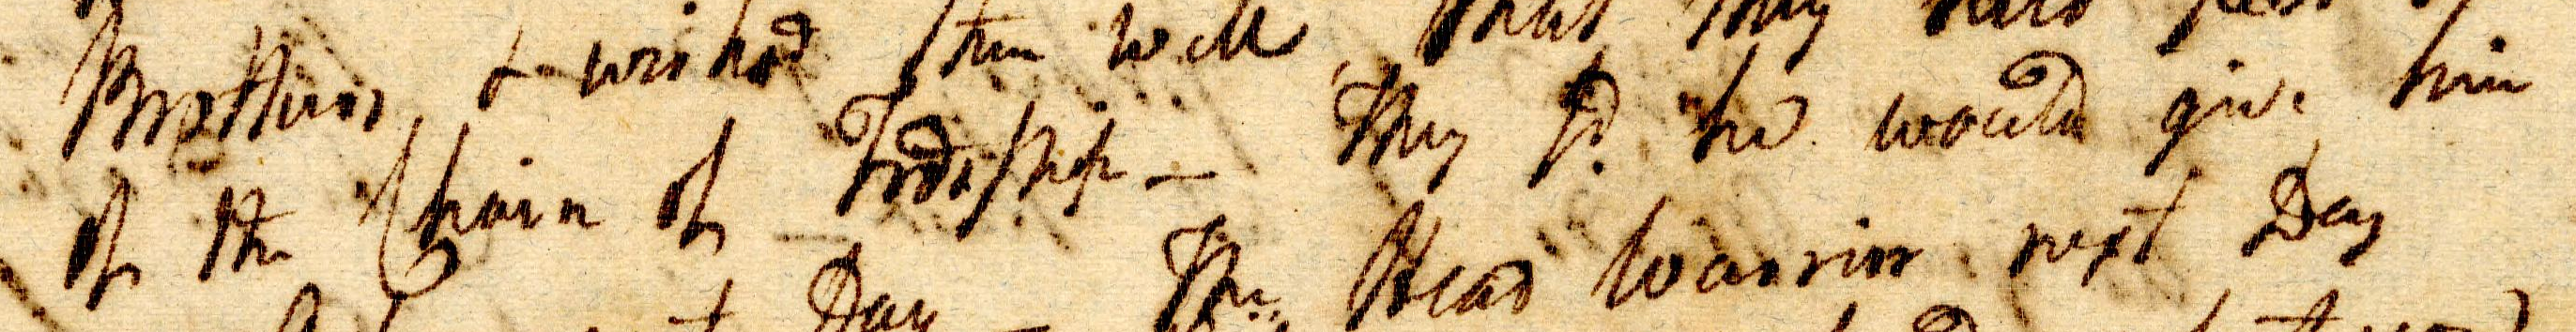of the Chain of Friendship- They sd. he would give him
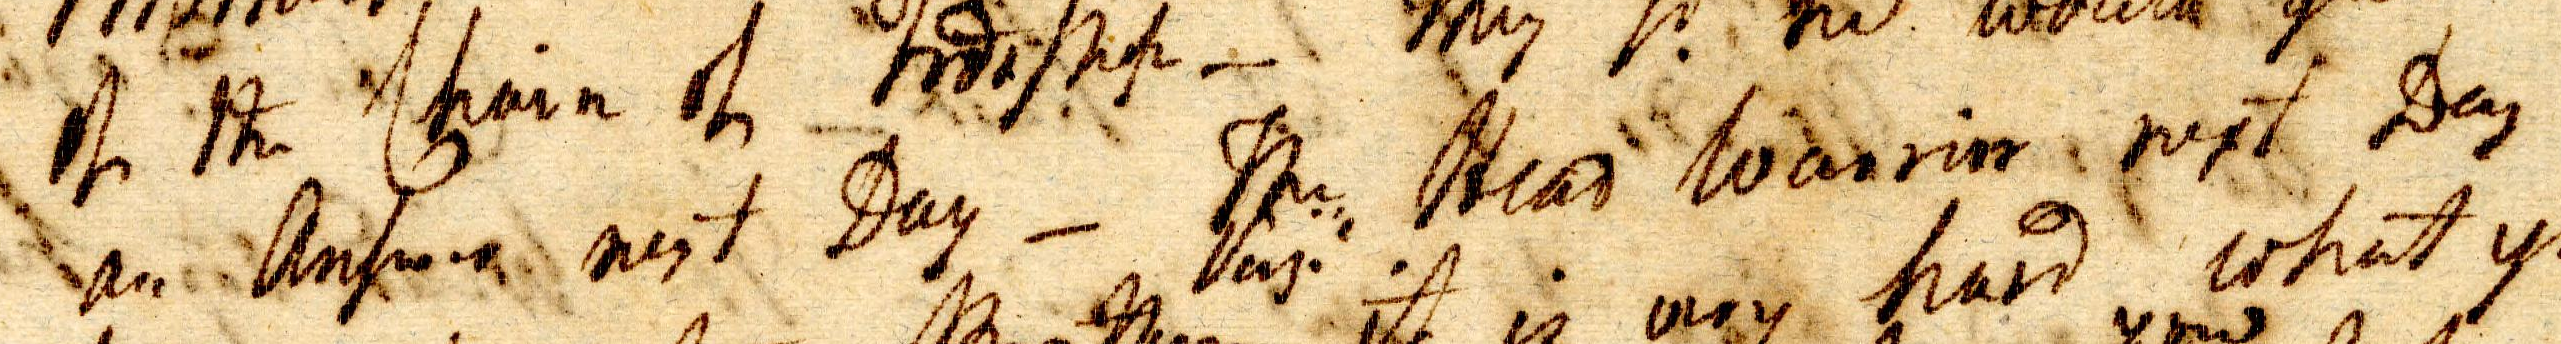an Answer next Day- The Head Warrior next Day
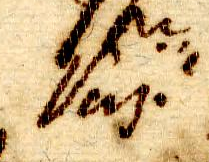Virg^a.
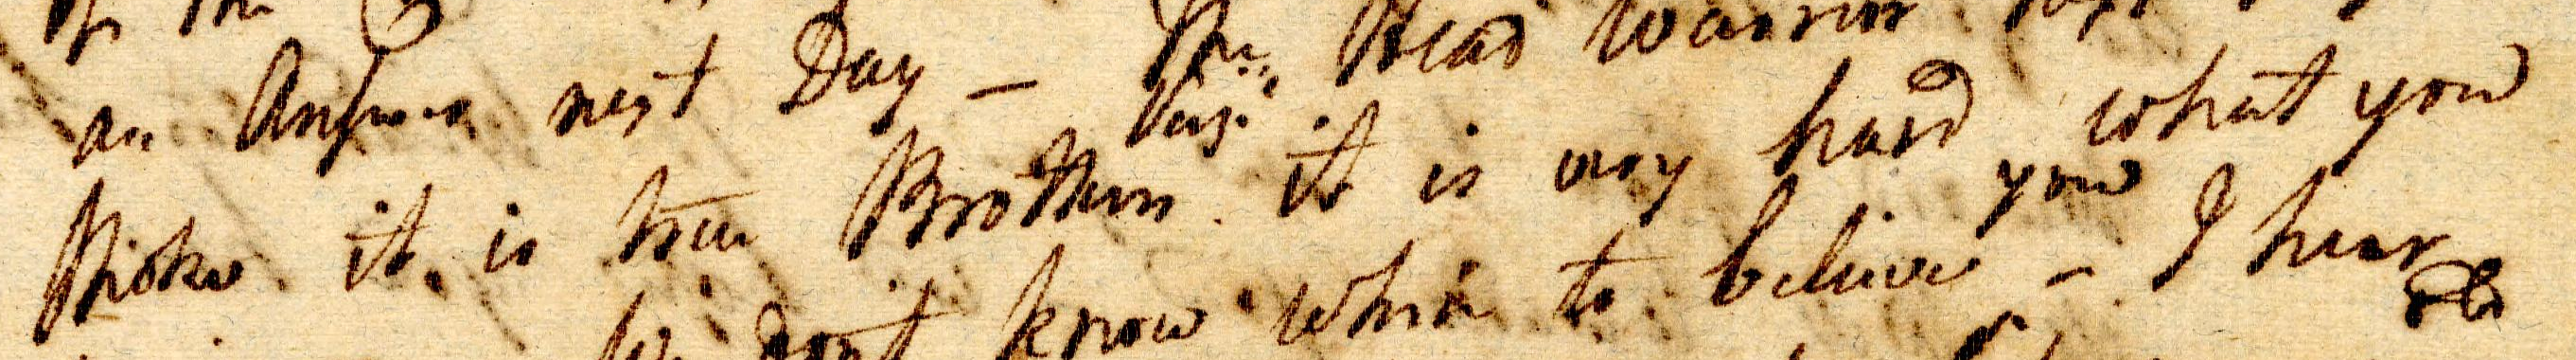stroke it is here Brothers ^ it is very hard what you
